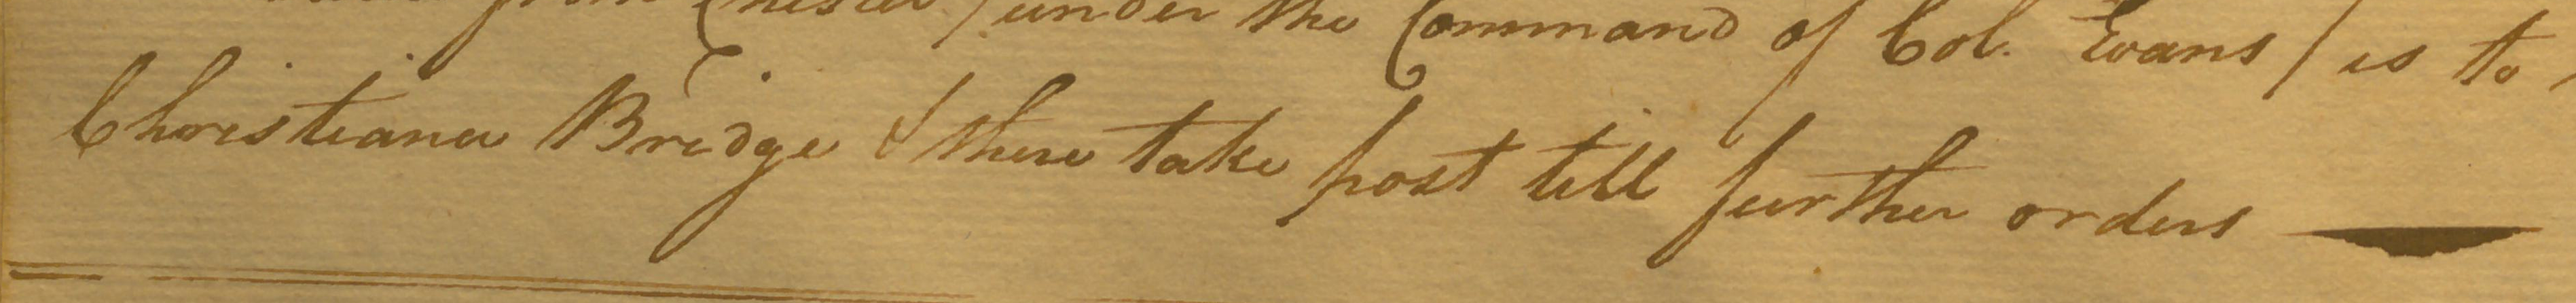Christiana Bridge & then take post till further orders-
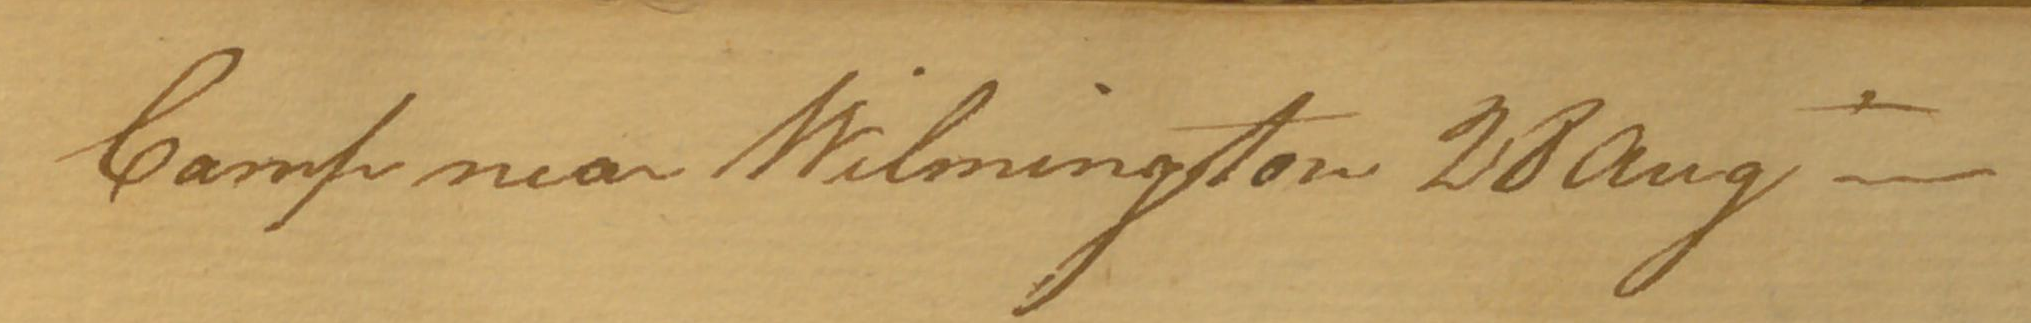Camp near Wilmington 28 Aug^t-
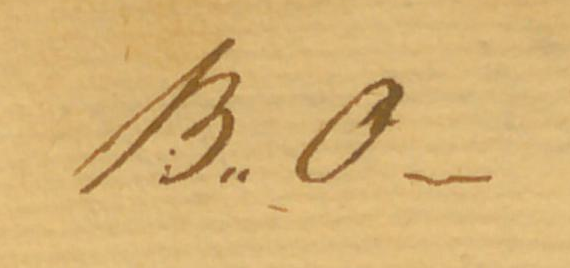B.O-
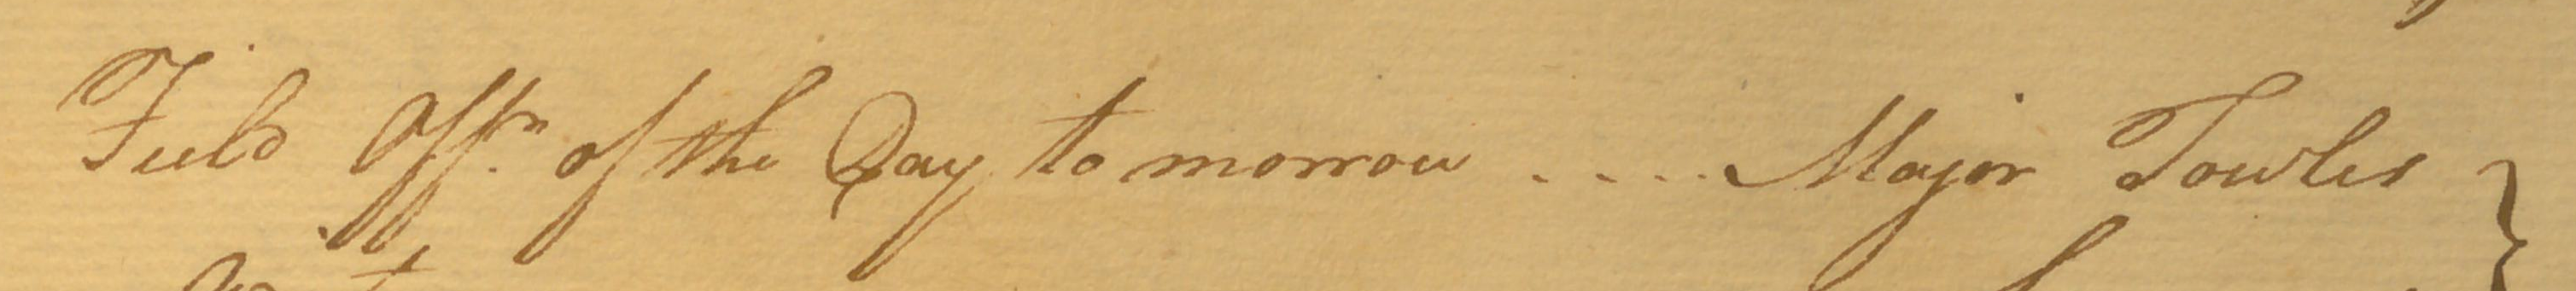Field Off^r. of the Day to morrow .... Major Towles
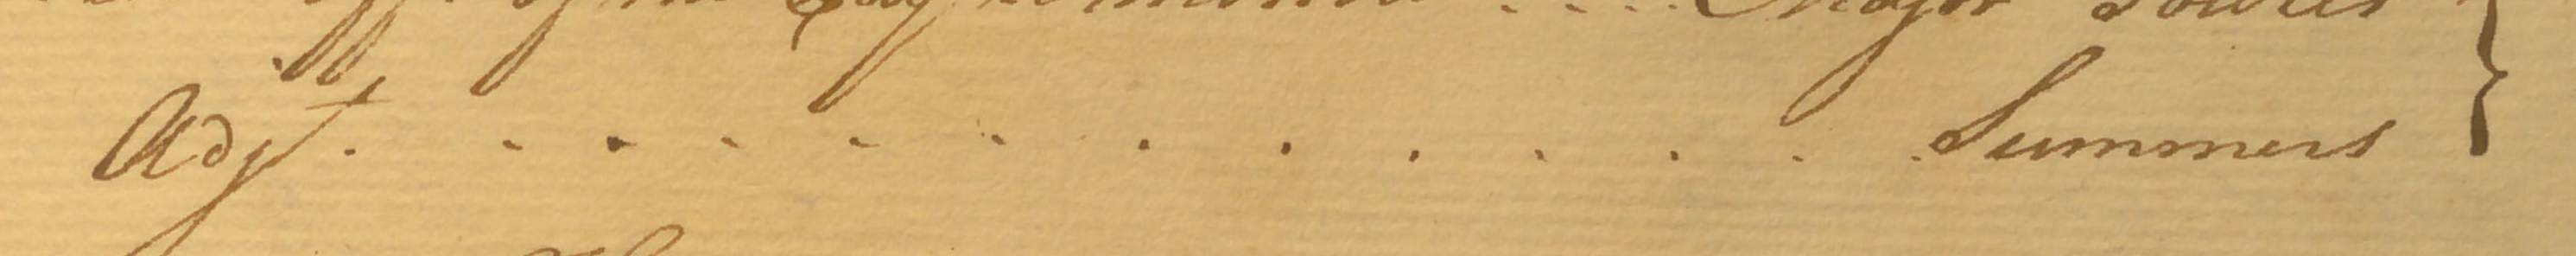Adj^t. ............ Summers
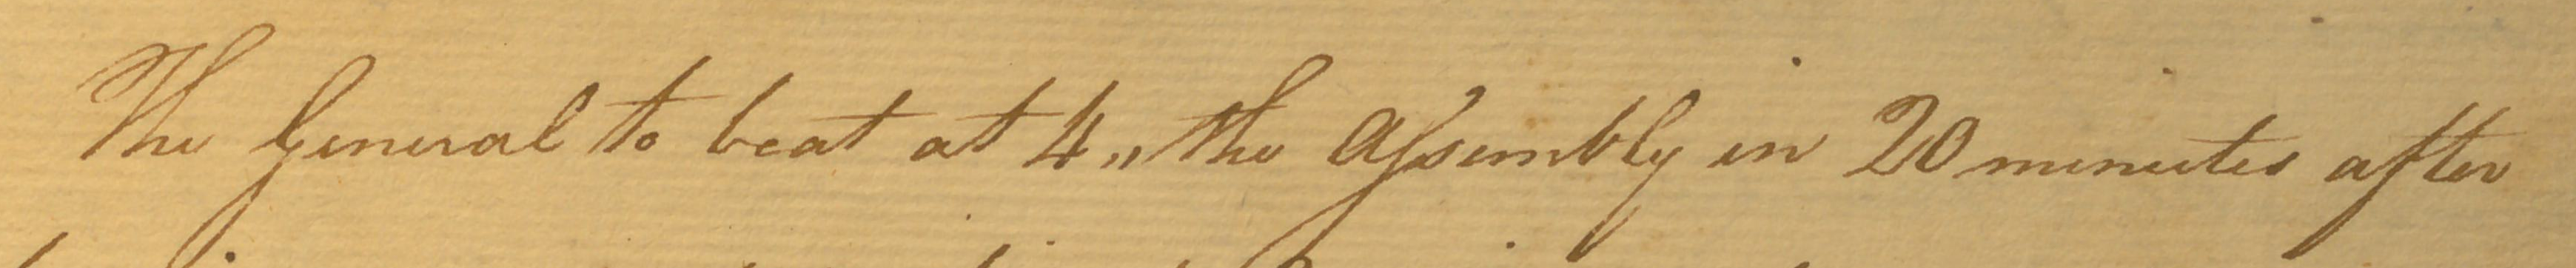The General to beat at 4. the Assembly in 20 minutes after
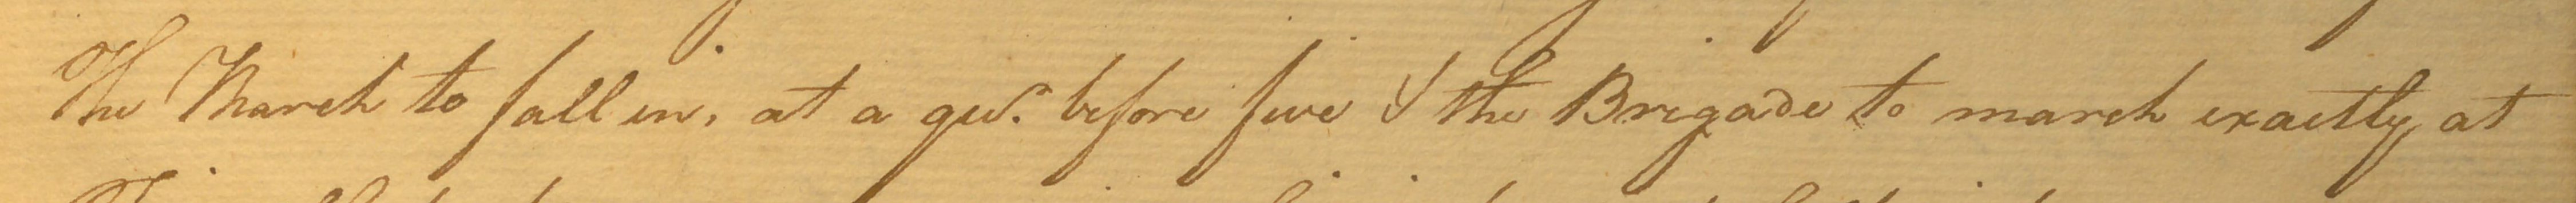The March to fall in, at a qu^r. before five & the Brigade to march exactly at
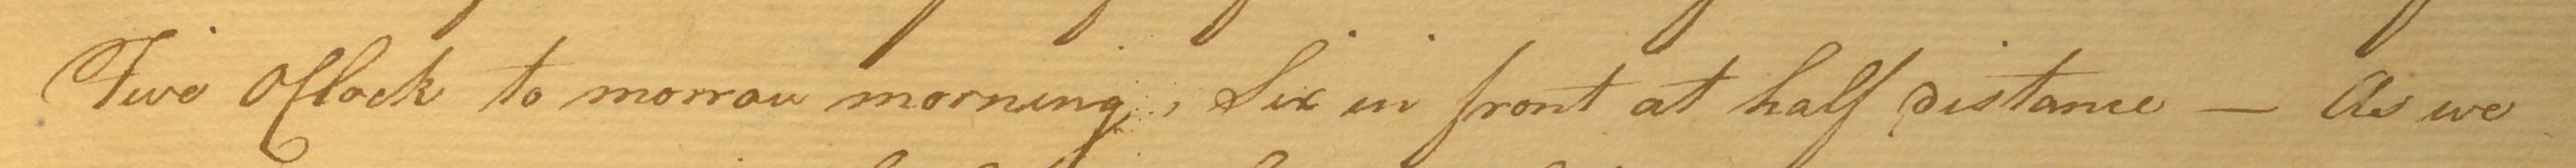Five oClock to morrow morning, Six in front at half distance- As we
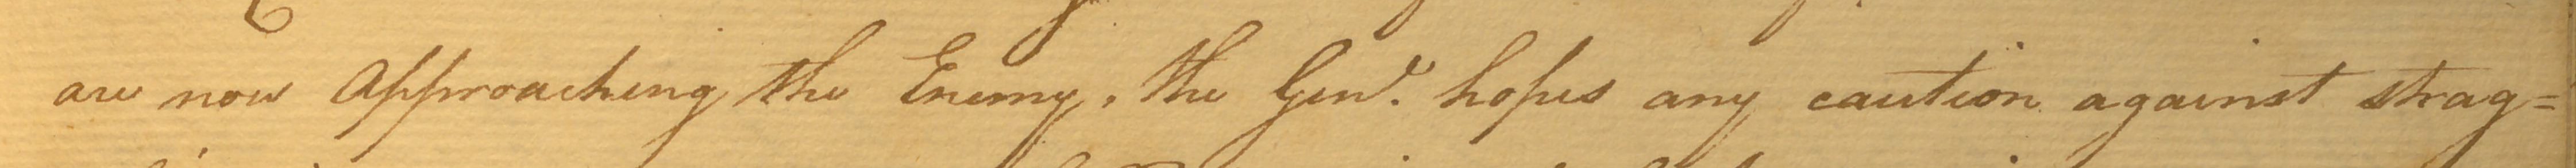are now approaching the Enemy, the Gen^l. hopes any caution against strag-
